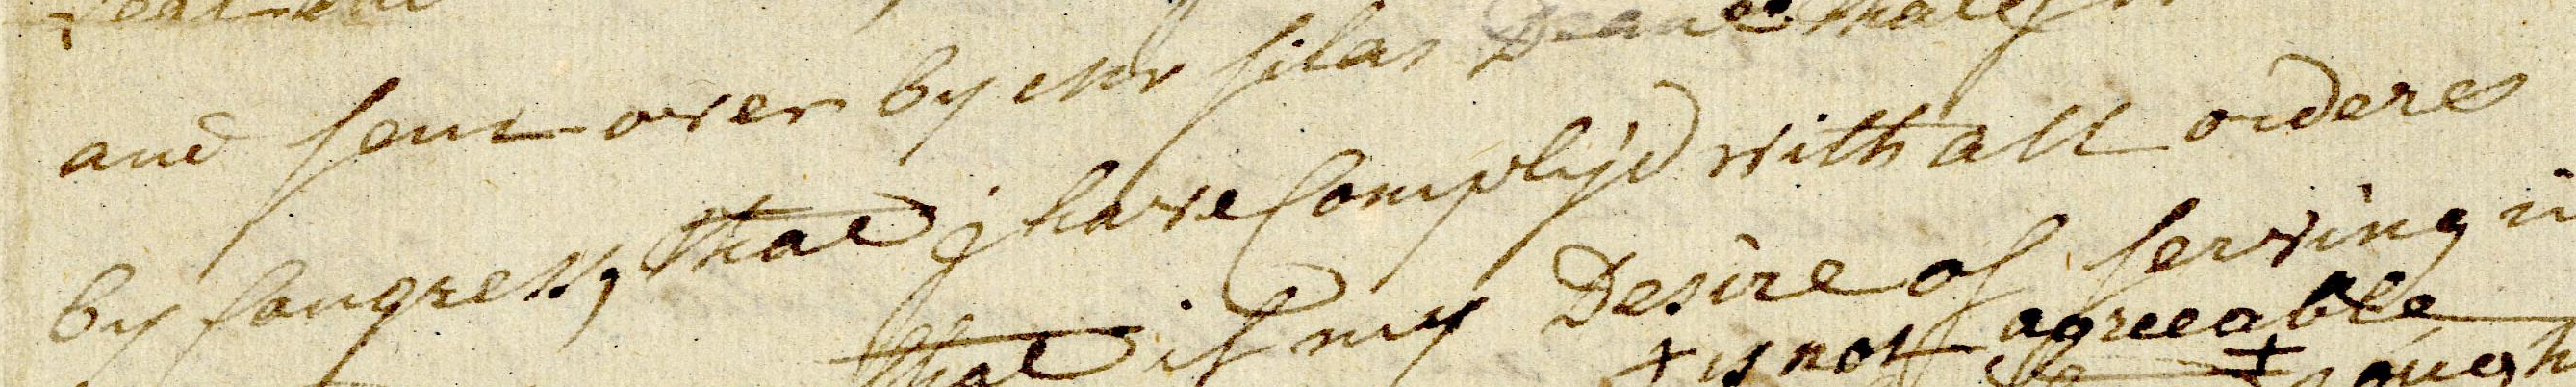by Congress, that I here Comply'd with all orders
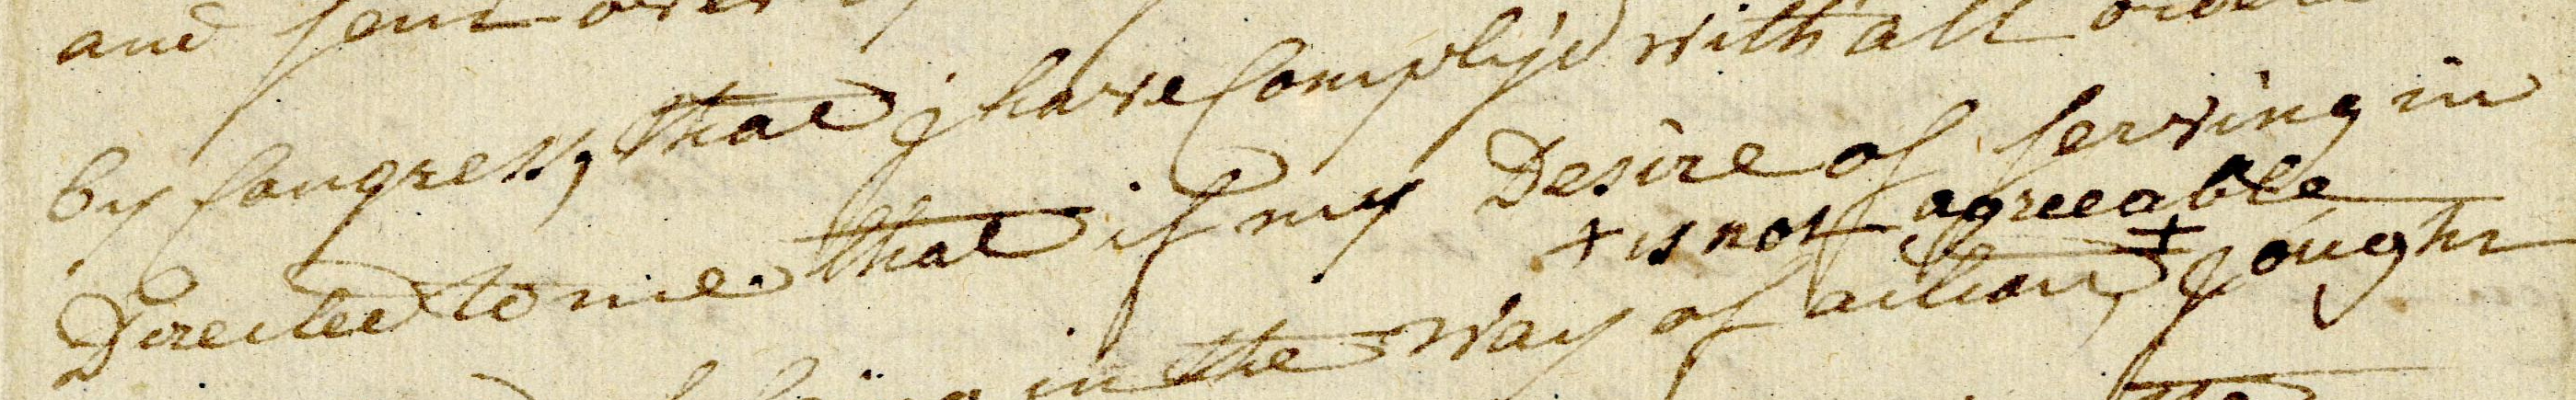Directed to me that if my Desire of serving in
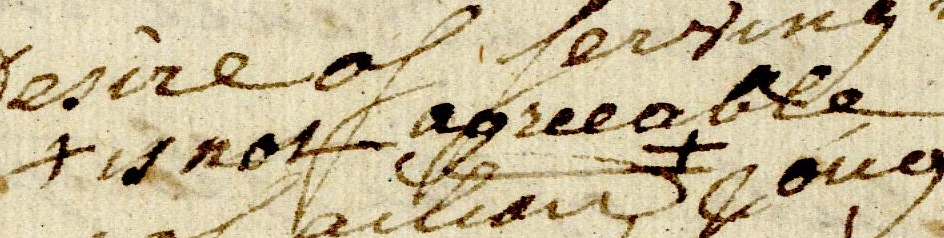+ is not agreeable
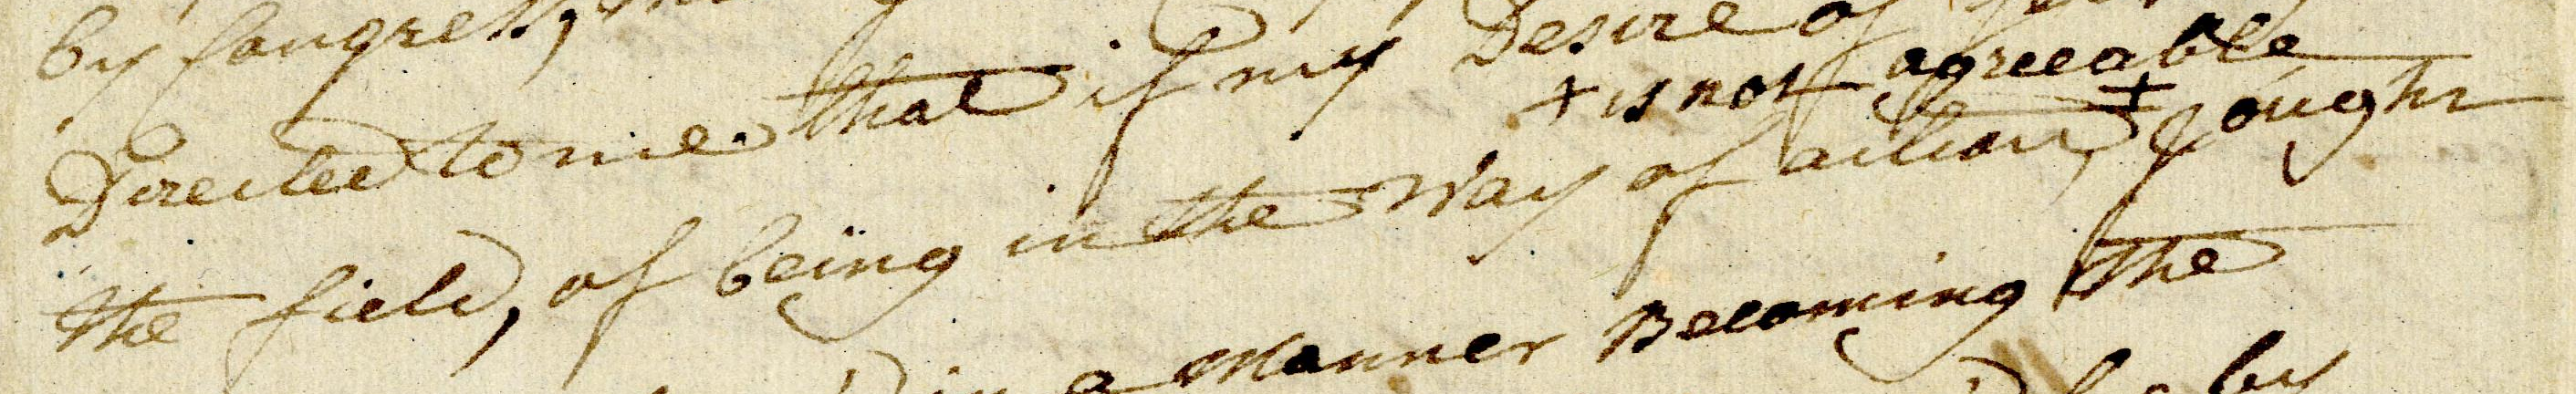the field, of being in the Ways of valiant + I ought
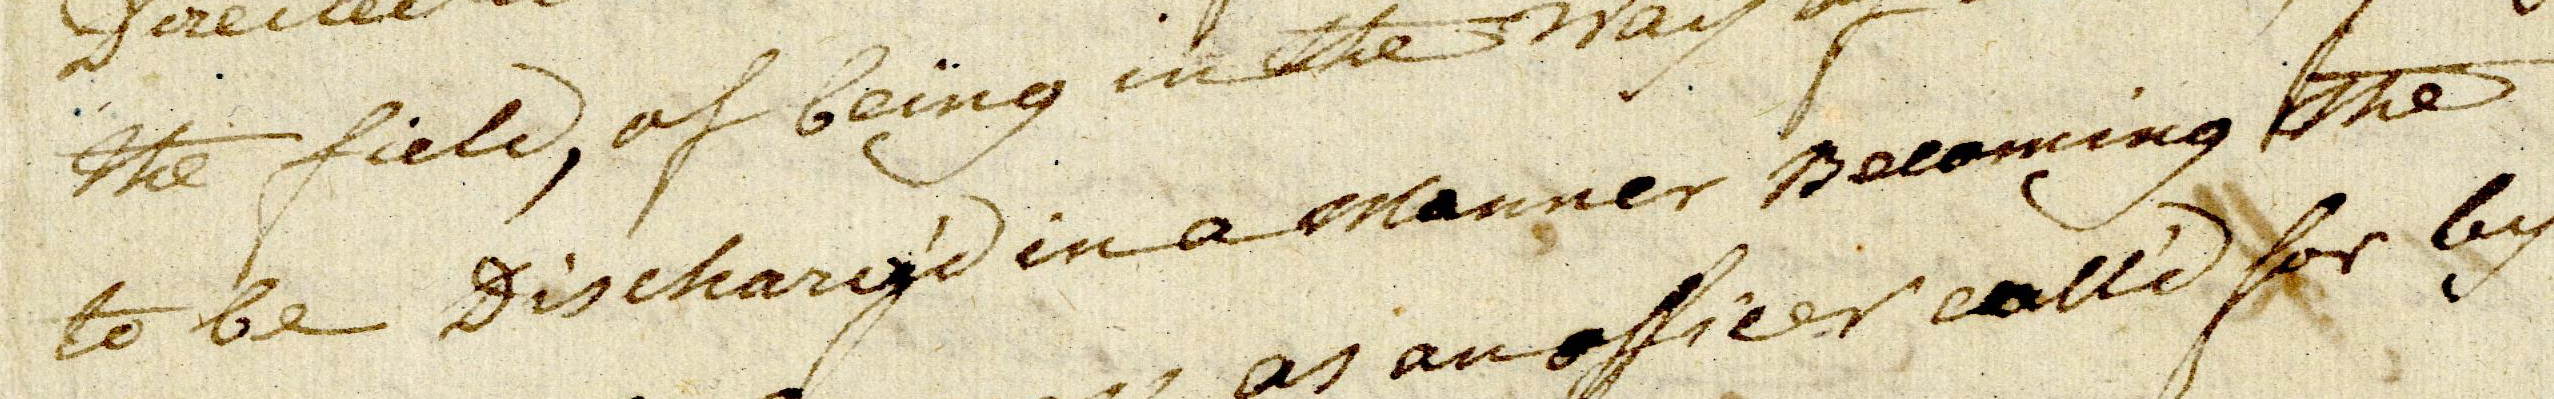to be discharg'd in a manner Becoming the
